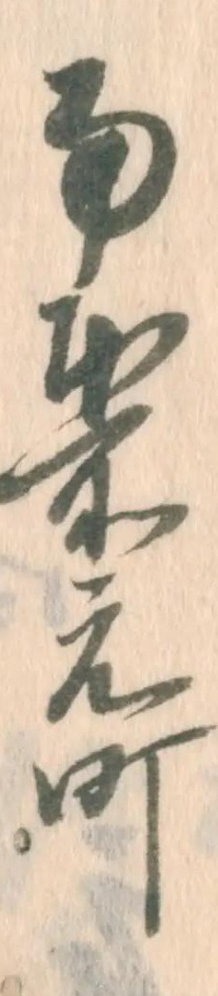南本所元町
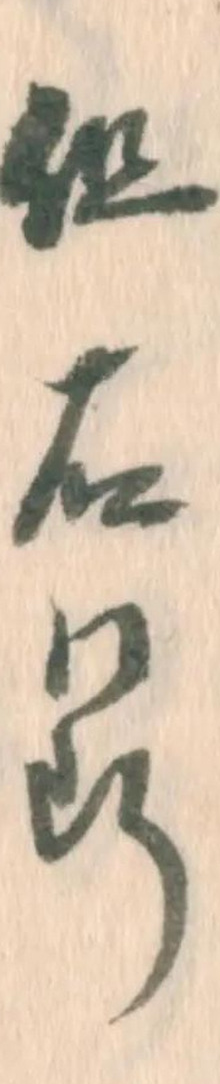但右同断
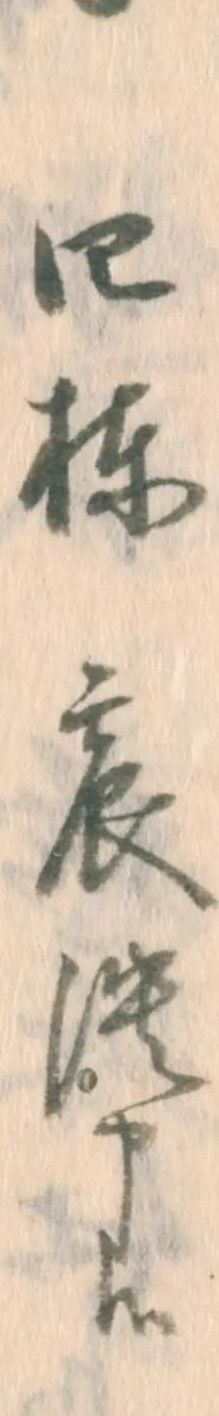内四棟震潰申候
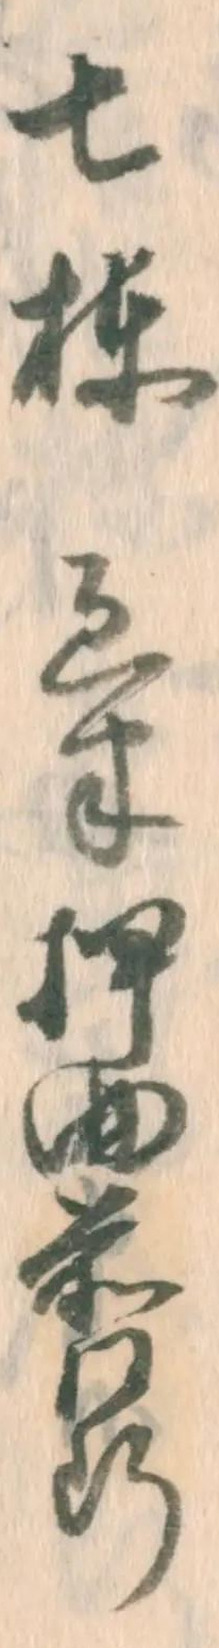七棟過半押曲前同断
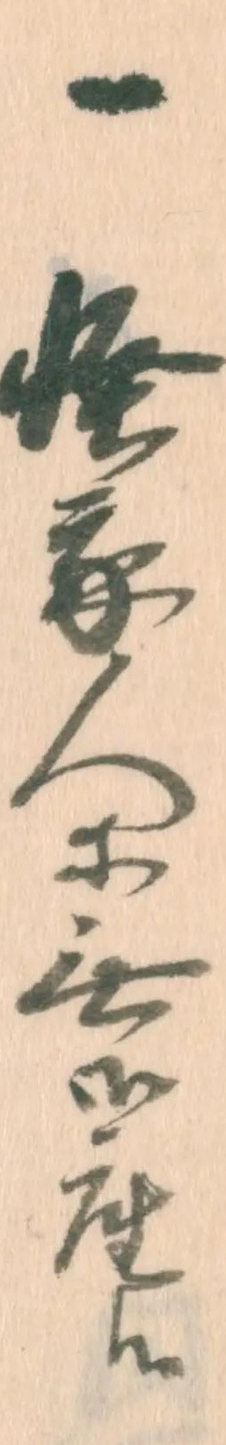一怪我人等無御座候
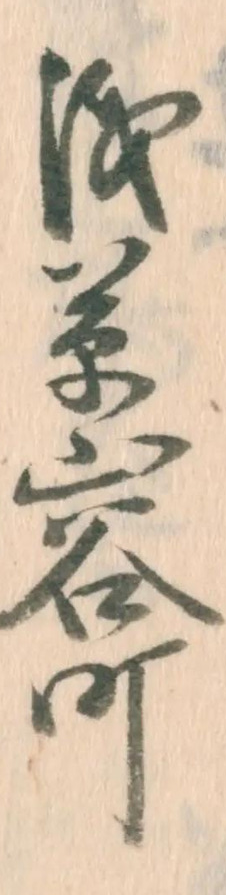浅草山谷町
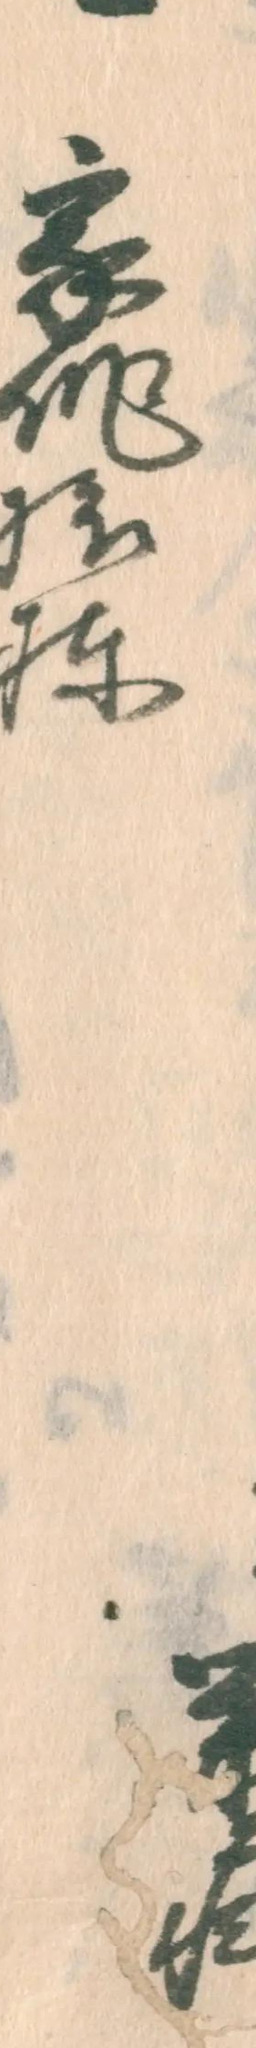一家作拾棟
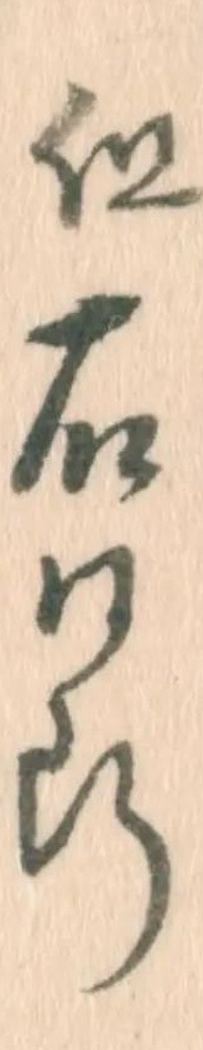但右同断
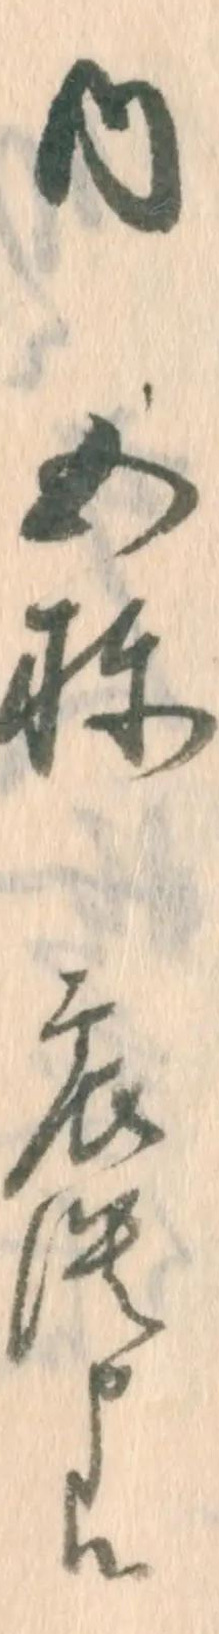内五棟震潰申候
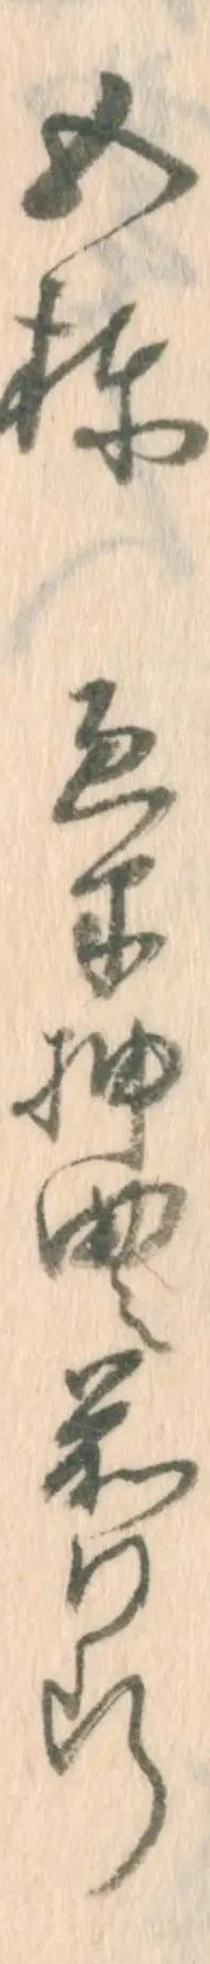五棟過半押曲前同断
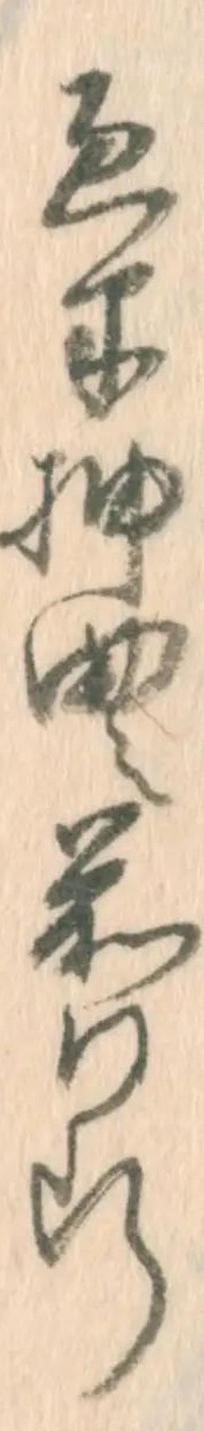七棟過半押曲前同断

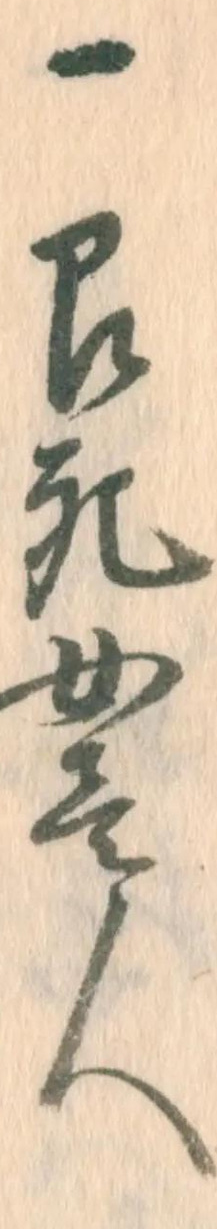一即死女壱人
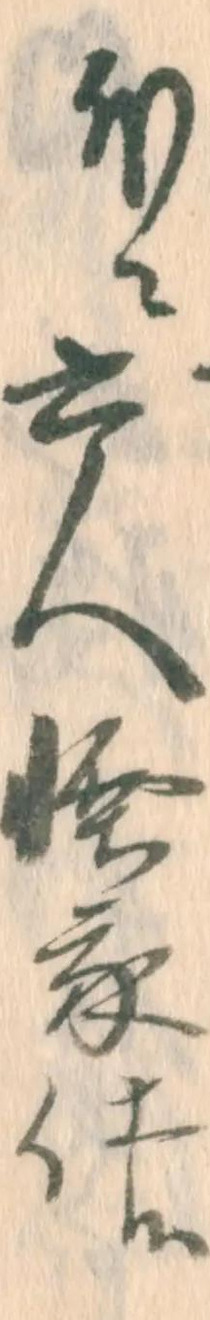外ニ六人怪我仕候
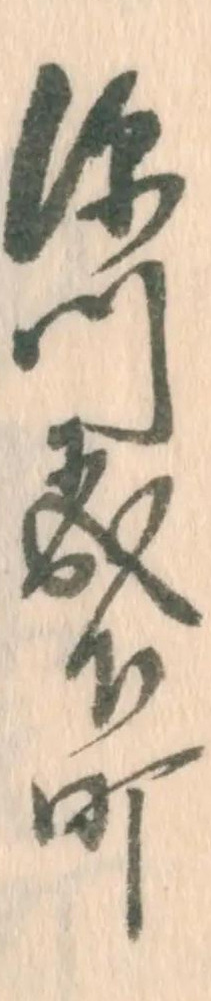深川森下町
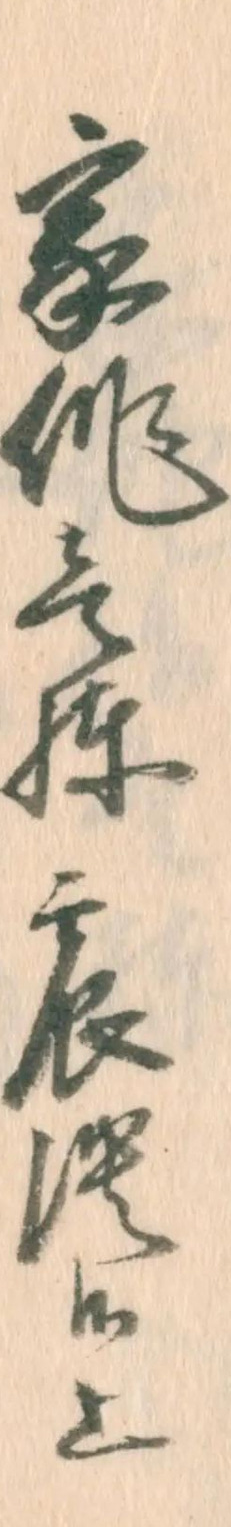一家作壱棟震潰候上
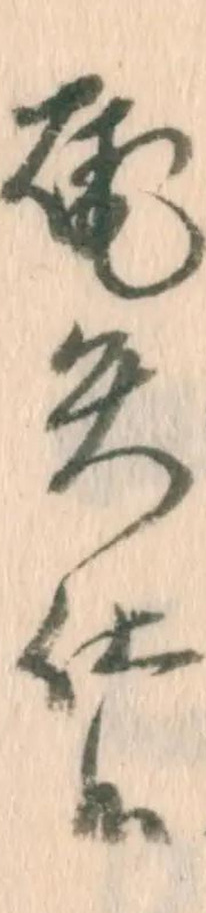焼失仕候
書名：地震災書留 2巻. [1] 内表紙に「地震災書留　安政二卯年　但本所深川御用屋敷地代免除調」とあり
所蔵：国立国会図書館 National Diet Library, JAPAN
